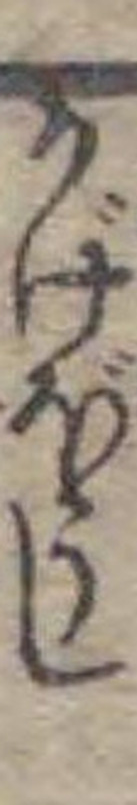かげぼうし
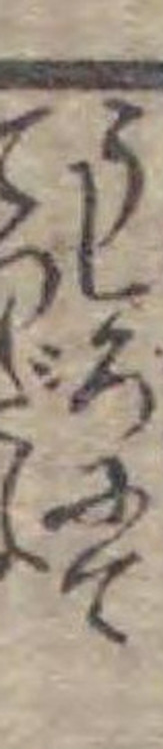うしろにて
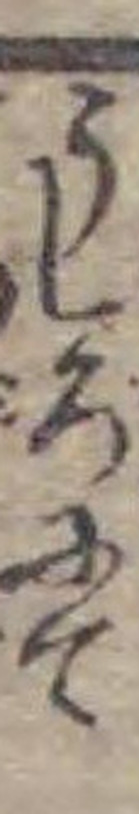うしろにて
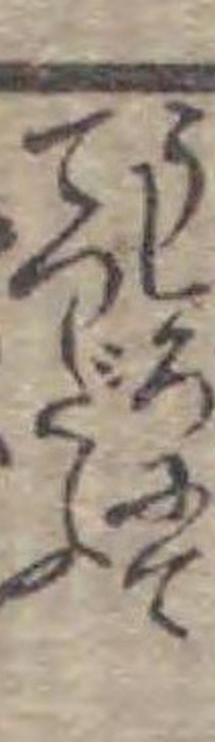てつだふ
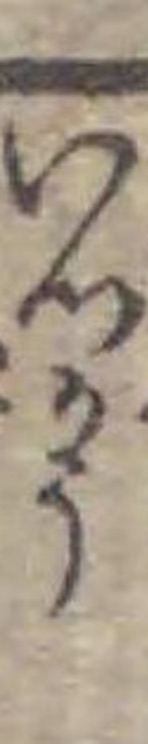いつかう
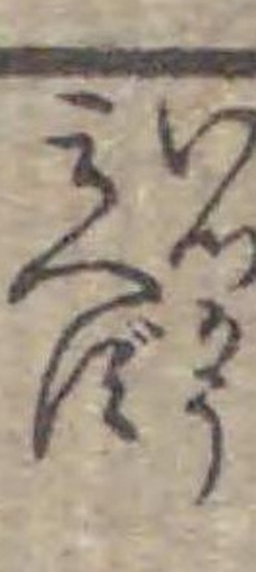みへず
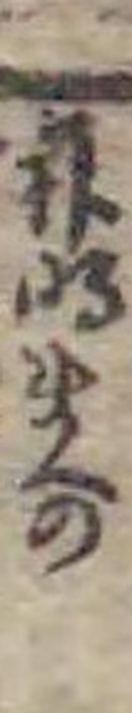神明まへの
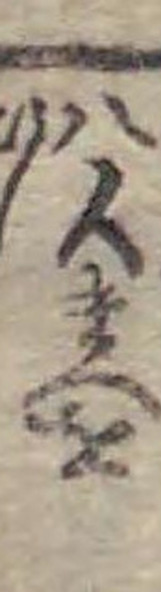八人まへを
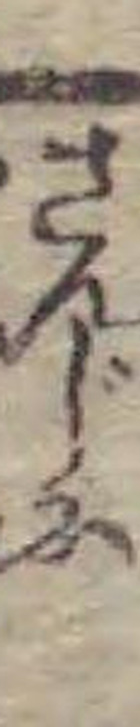さんじに
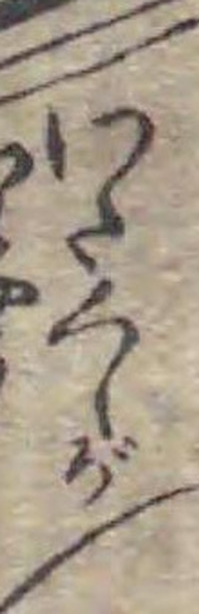わたくしが
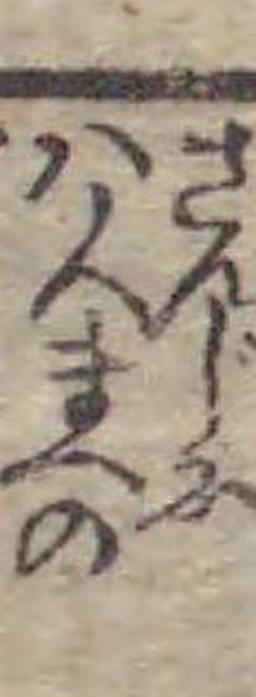七人まへの
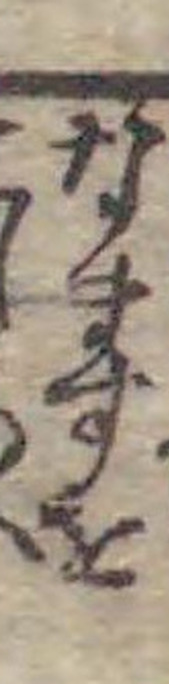なますを
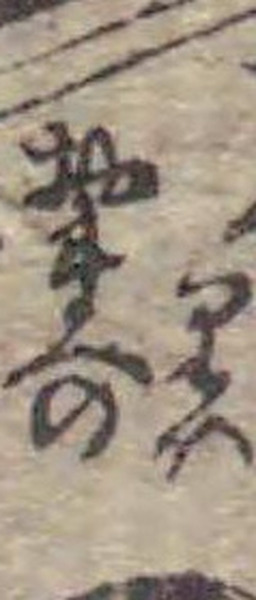おまへの
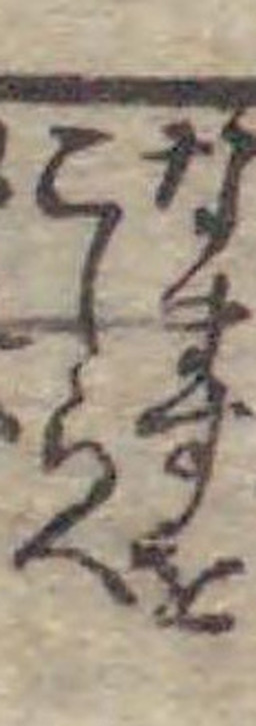こしらへ
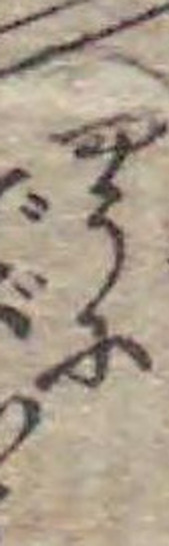やうに
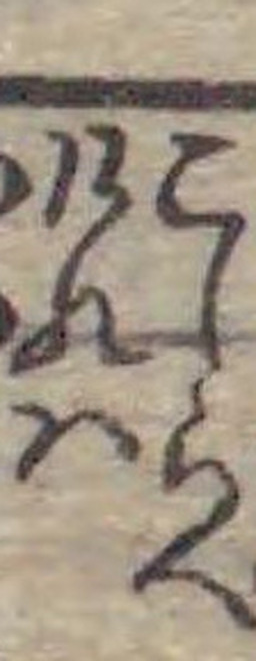けれは
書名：時代世話二挺皷 : 2巻
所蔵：国立国会図書館 National Diet Library, JAPAN
